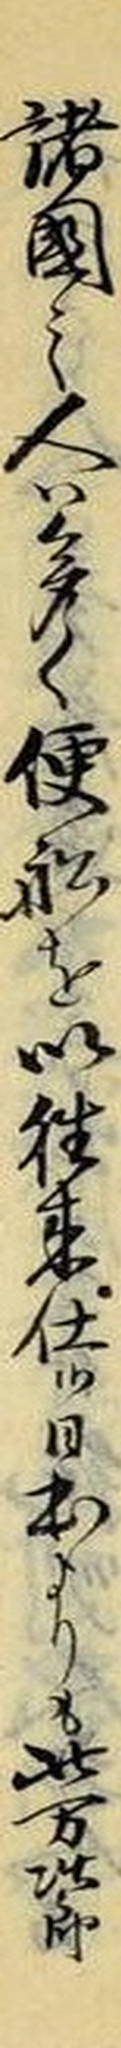諸国之人ハ多く便船を以往来仕候日本よりも此万次郎
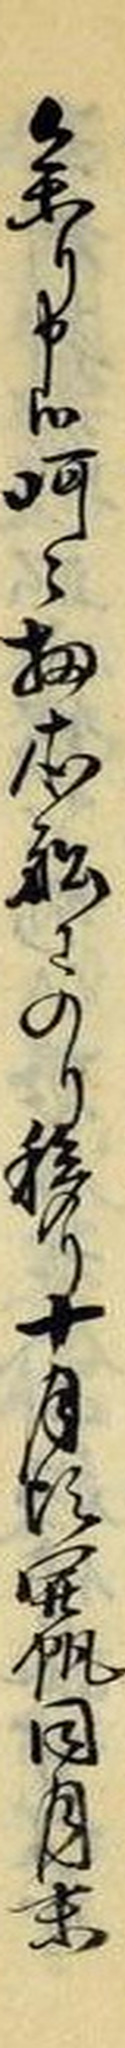参り申候呵々物本船にのり移り十月頃開帆同月末
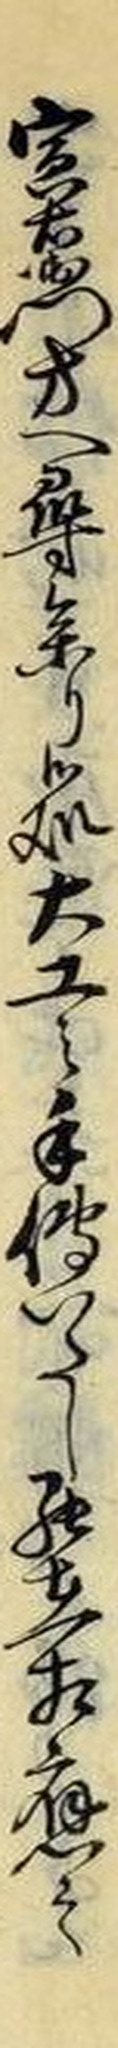寅右衛門方へ尋参り候処大工之手伝いたし罷在相応て
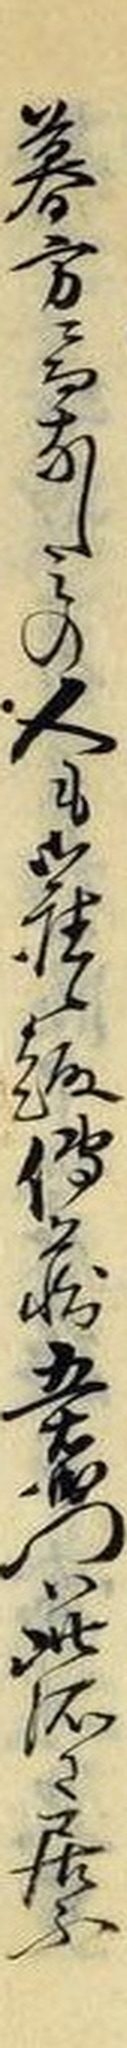暮方ニ而なしミの人も御座候趣傳蔵五右衛門ハ此所に居不
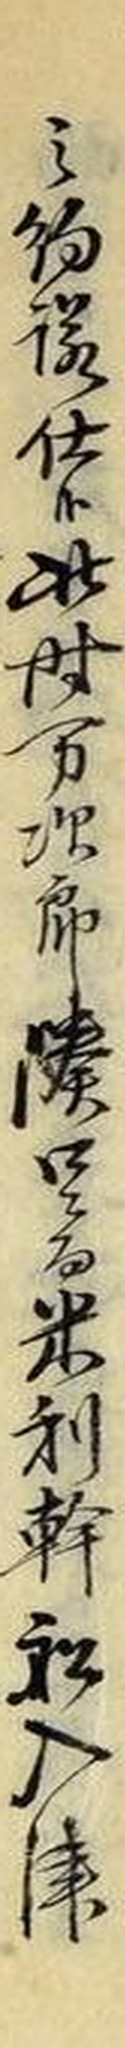之約諾仕候此時万次郎湊口二而米利幹船入津
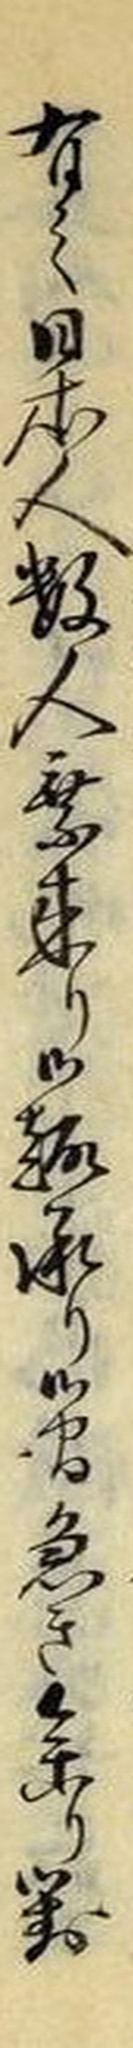有之日本人数人乗来り候趣承り候間急き参り対
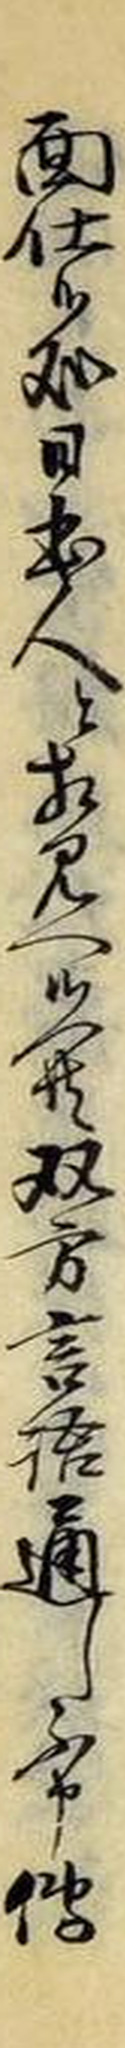面仕候処日本人と相見へ候へ共双方言葉通し不申傳
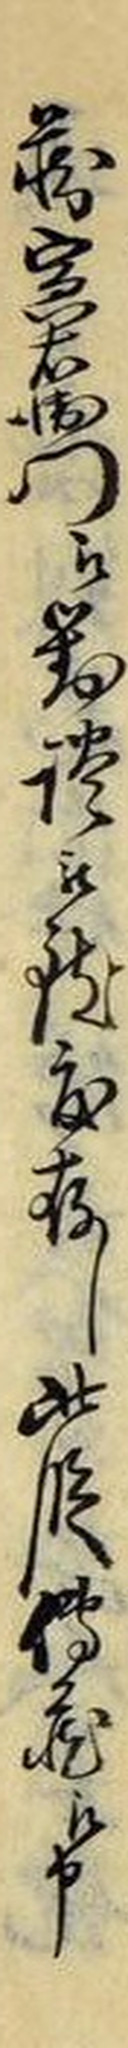蔵寅右衛門江対談被致度存し此段傳蔵江申

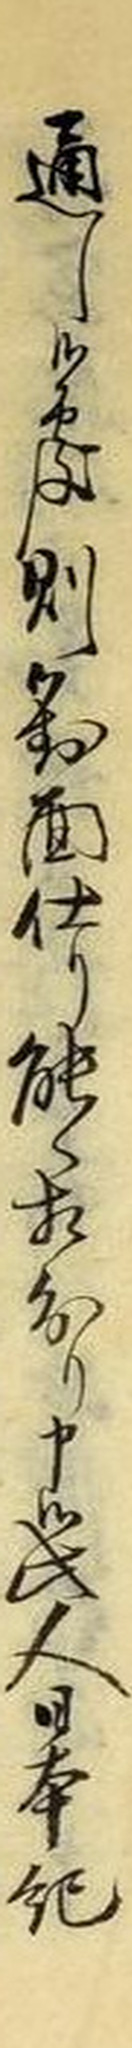通し候處則対面仕り能く相分り申候此人日本紀
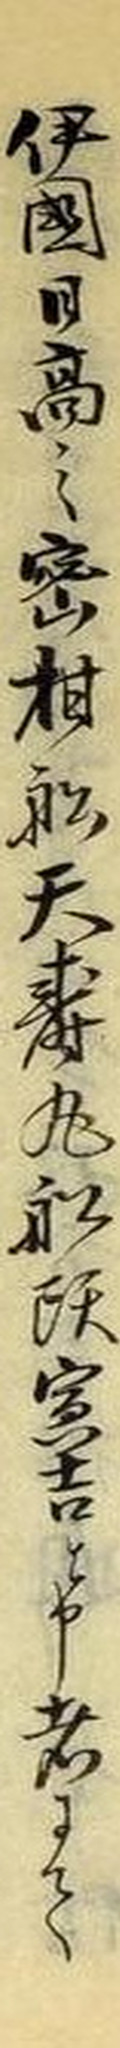伊国日高之蜜柑船天壽丸船頭寅吉と申者にて
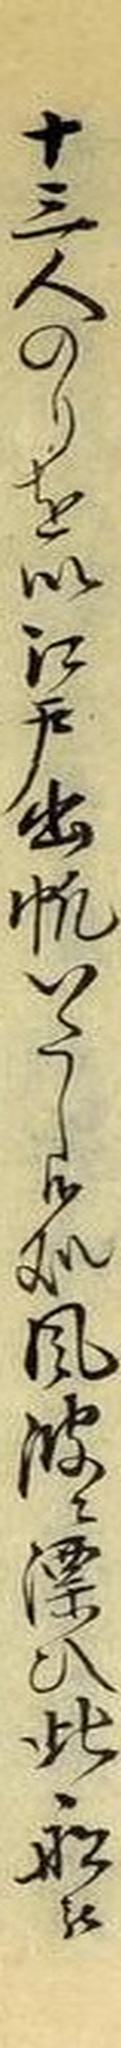十三人のりを以江戸出帆いたし候処風波ニ漂ひ此船被
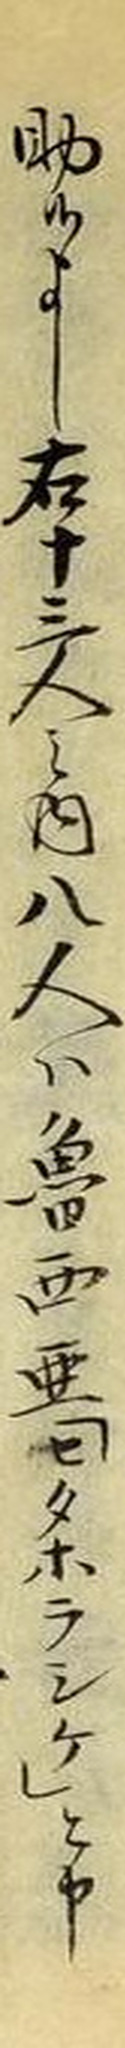助候よし右十三人之内八人ハ魯西亜「セタホラシケ」と申
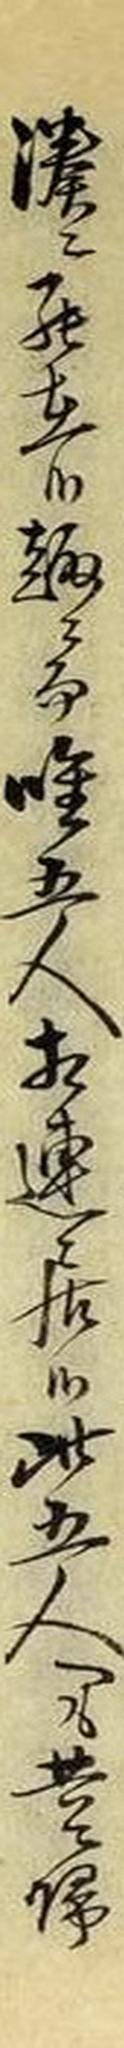湊ニ罷在候趣ニ而唯五人相連居候此五人へも共ニ帰
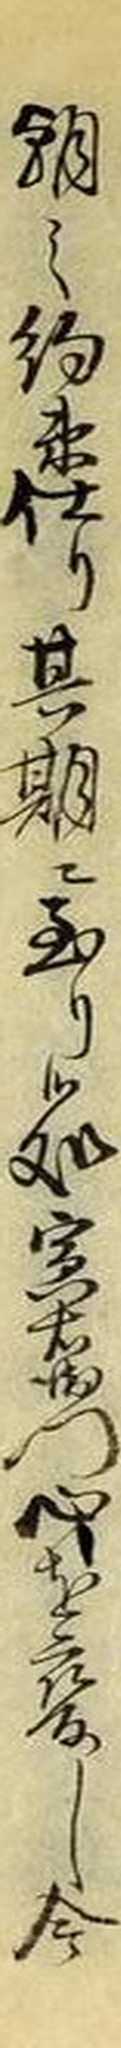朝之約束仕り其期ニ至り候処寅右衛門心を変し今
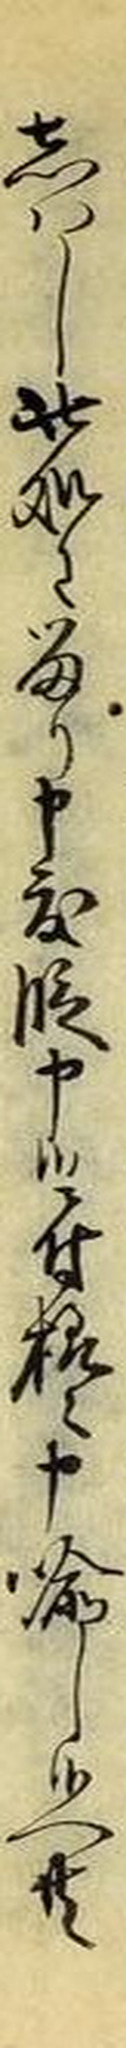しハし此処に留り申度段申候二付様々申喩し候へ共
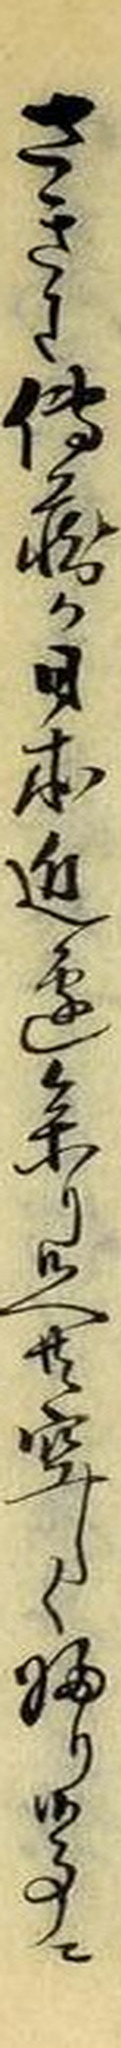さきに傳蔵か日本近辺参り候へ共空しく帰り候事ニ
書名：漂客談奇（備考雑録写8）
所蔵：福井県文書館 Fukui Prefectural Archives
